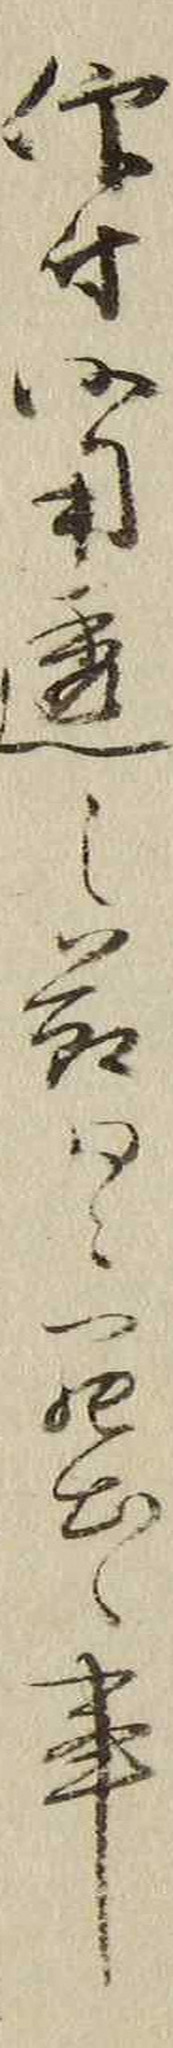仰付御用透之節日々罷出候事
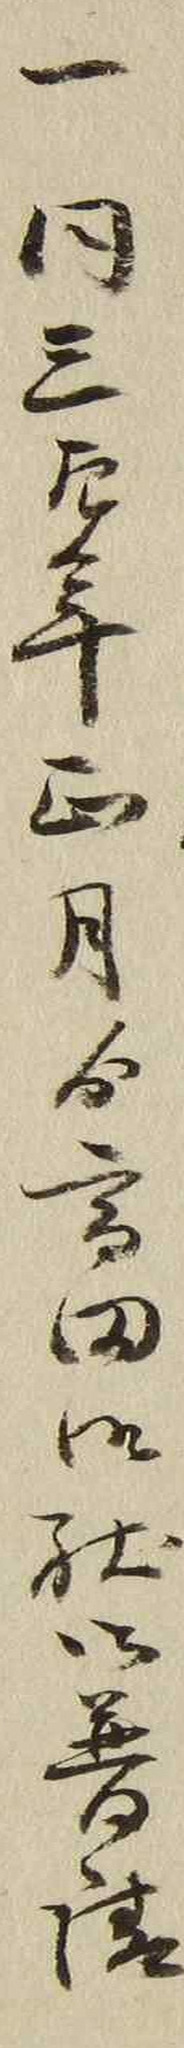一同三辰年正月ゟ高田御社御普請
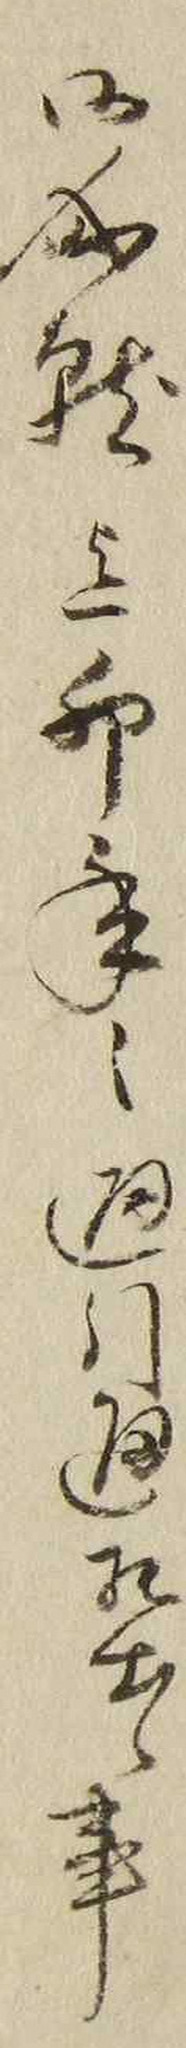御成就迄卯年之通引通罷出候事

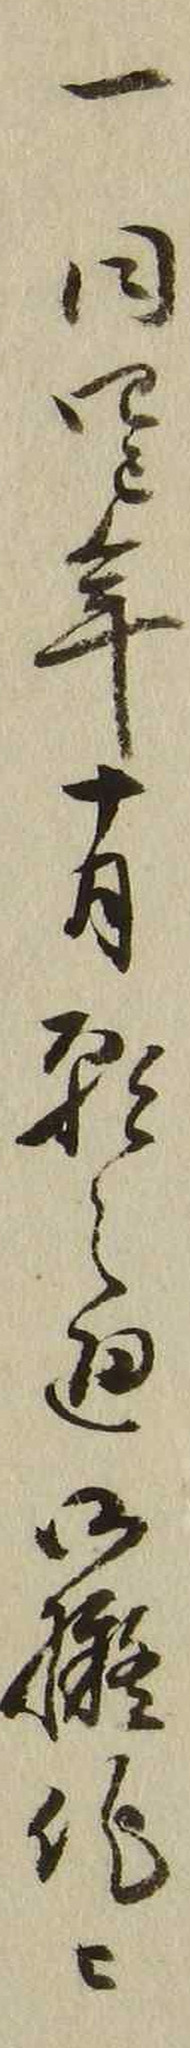一同四巳年十月願之通御擬作被
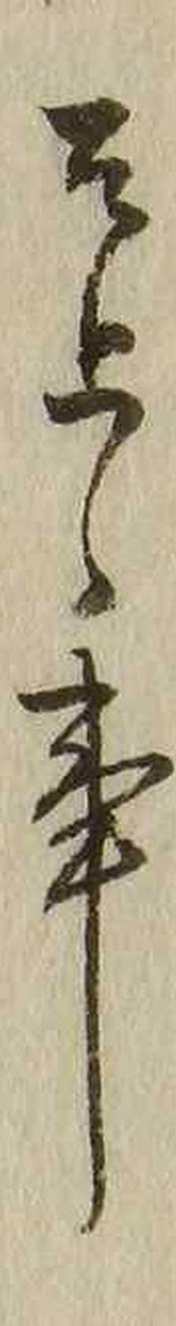召上候事
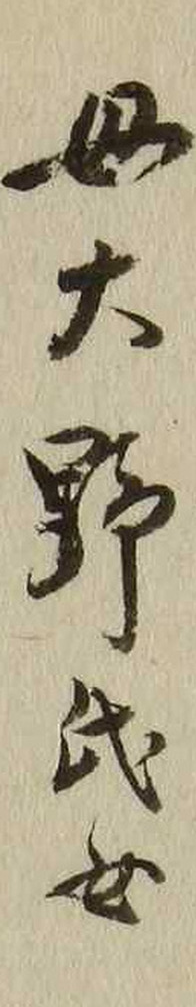母大野氏女
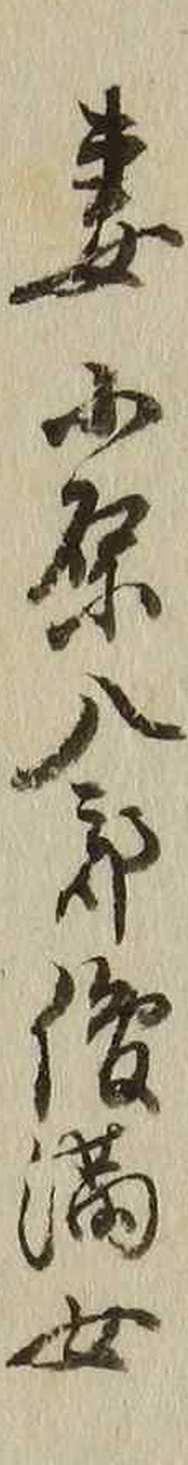妻小原八郎俊満女
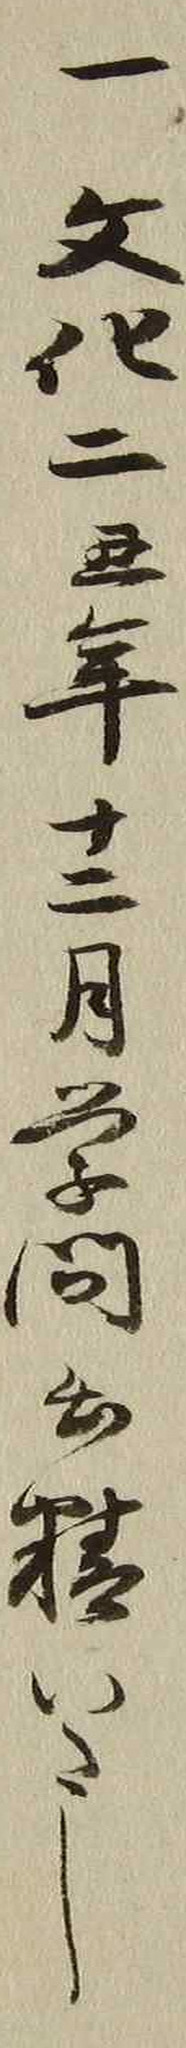一文化二丑年十二月学問出精いたし
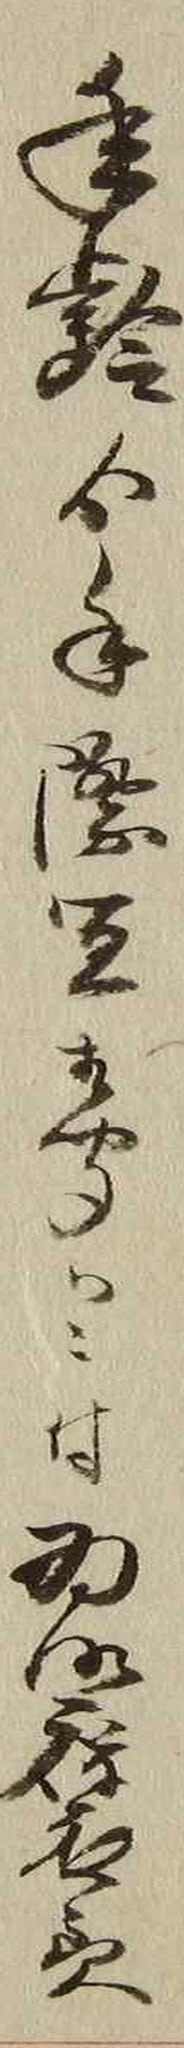年齢ゟ手際宜相聞候ニ付為御褒美
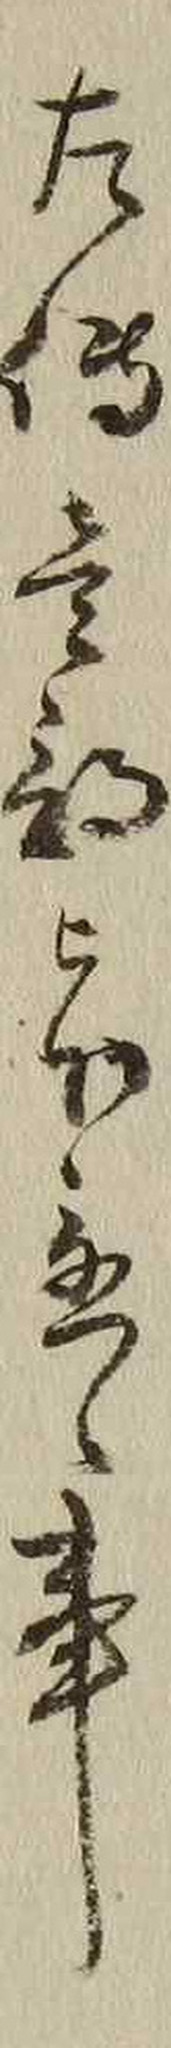左伝壱部被下置候事
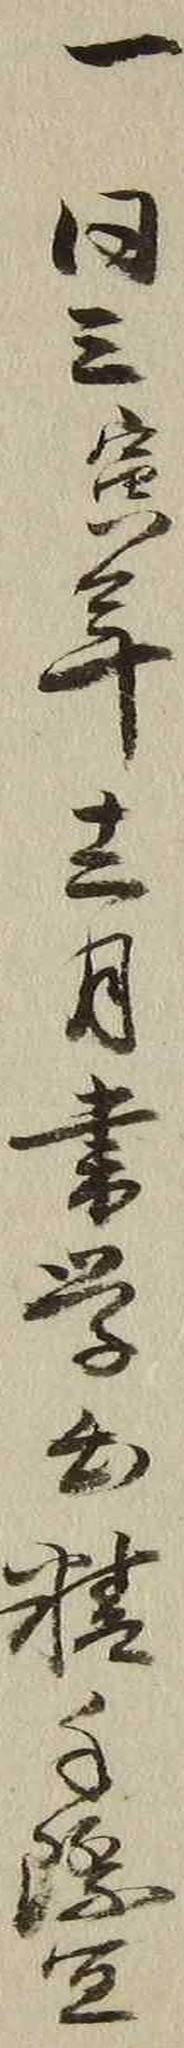一同三寅年十二月書学出精手際宜
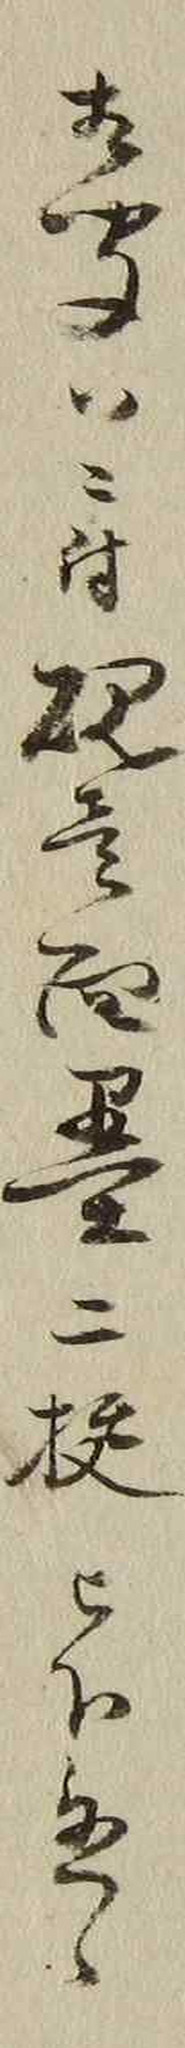相聞候ニ付硯壱面墨二挺被下置候
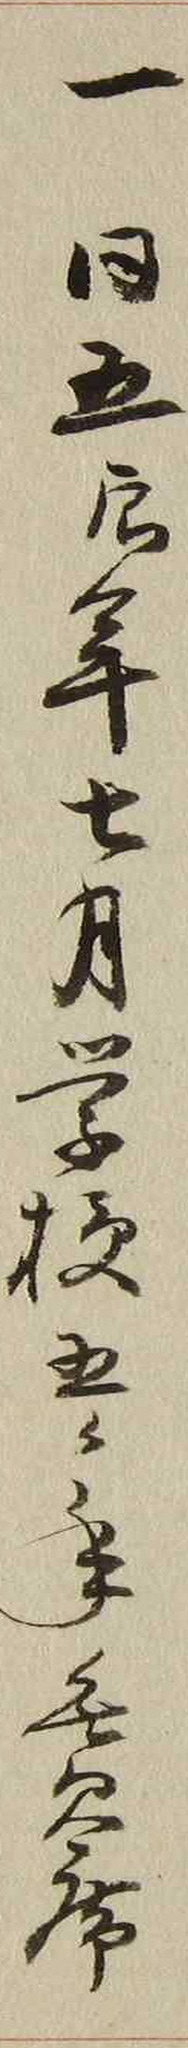一同五辰年七月学校五ヶ年無欠席
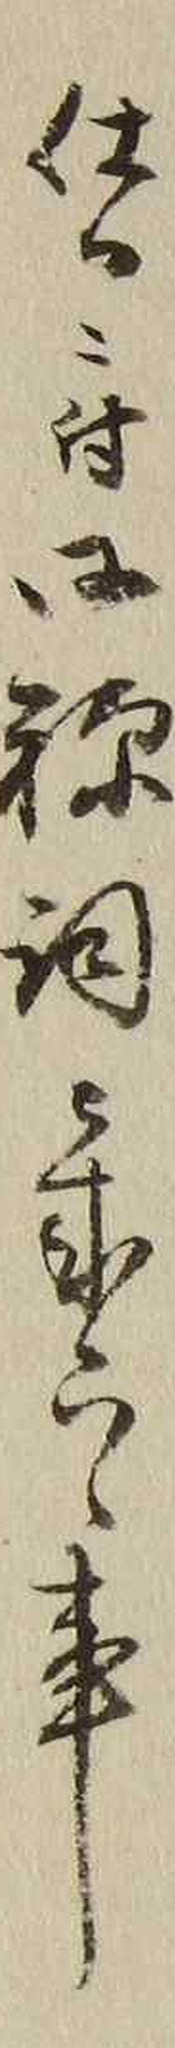仕候ニ付御称詞被成下候事
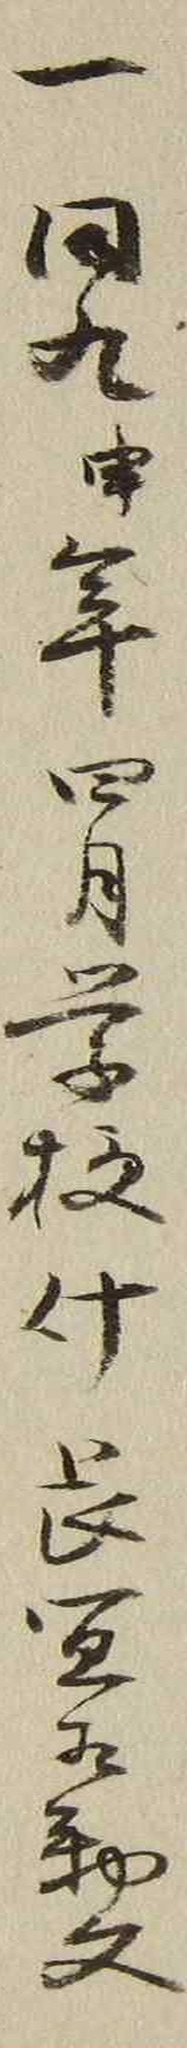一同九申年四月学校什長宜勤文
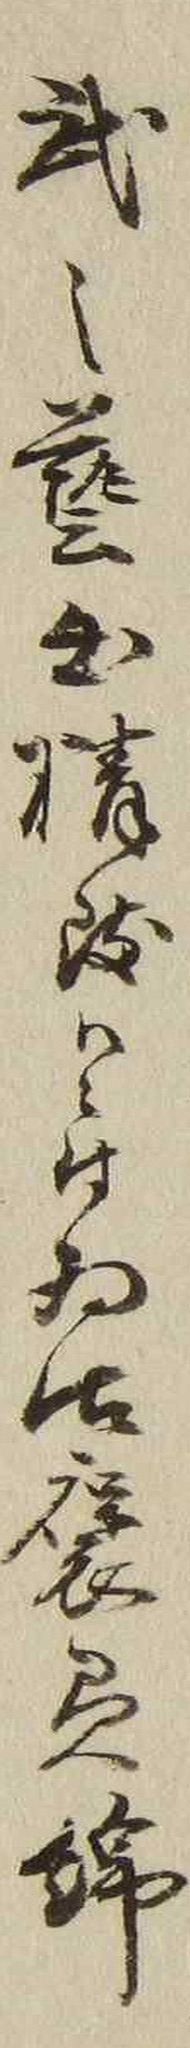武之芸出精致候ニ付為御褒美綿
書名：諸士系譜　巻之236　ふ之部4
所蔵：会津若松市立会津図書館
